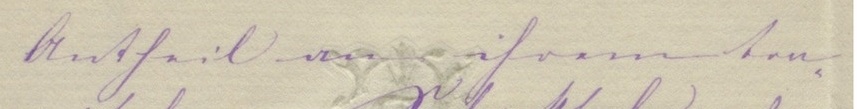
Antheil an ihrem tra-
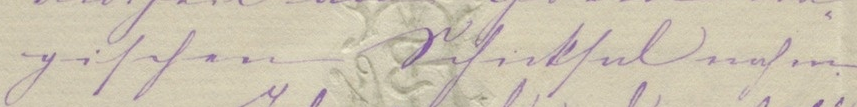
gischen Schicksal nahm.
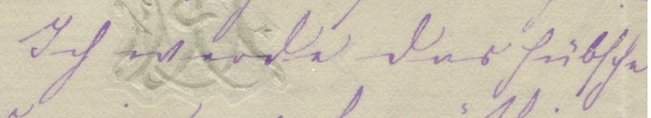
Ich werde das hübsche
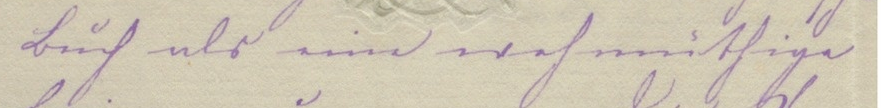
Buch als eine wehmüthige
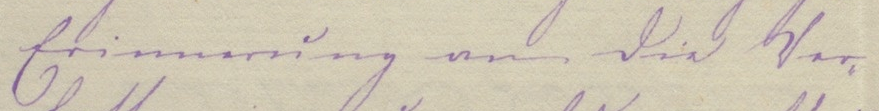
Erinnerung an die Ver-
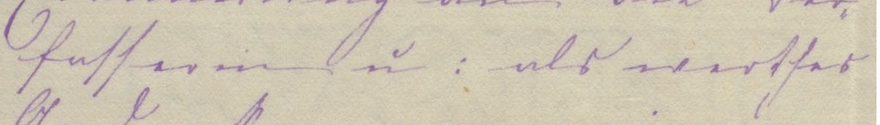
fasserin u: als werthes
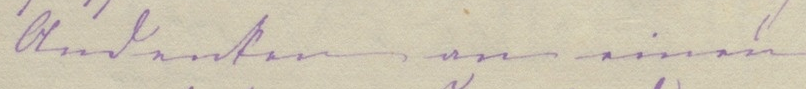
Andenken an einen
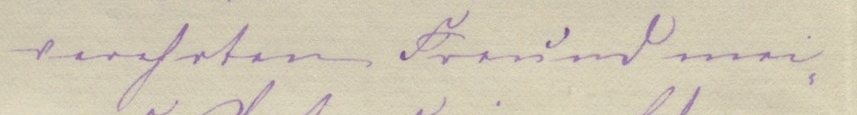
verehrten Freund mei-
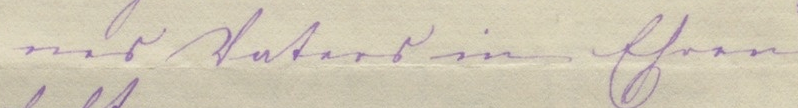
nes Vaters in Ehren
